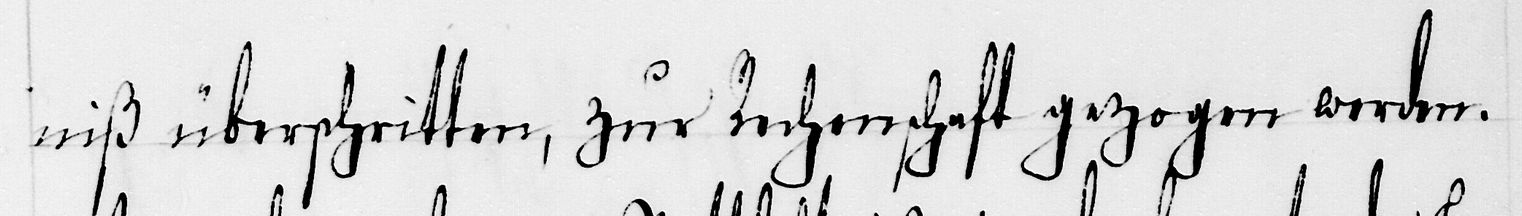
niß überschritten, zur Rechenschaft gezogen werden.
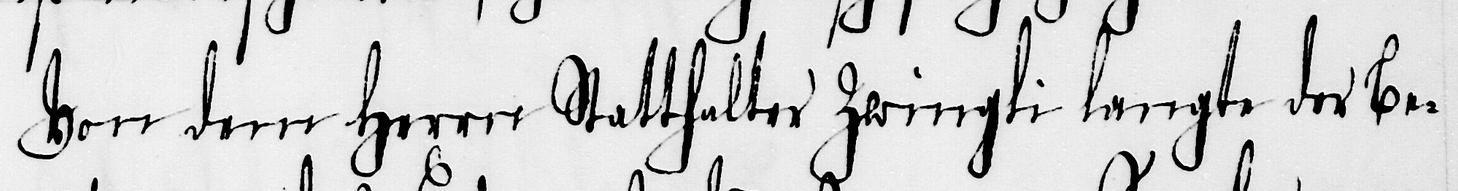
Von dem Herrn Statthalter Zwingli langte der Be¬
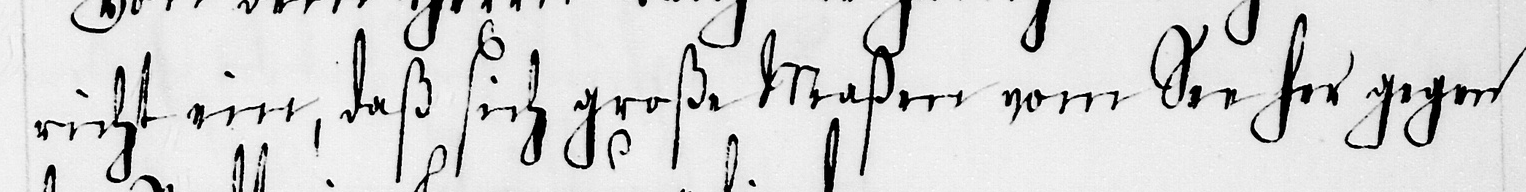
richt ein, daß sich große Maßen vom See her gegen
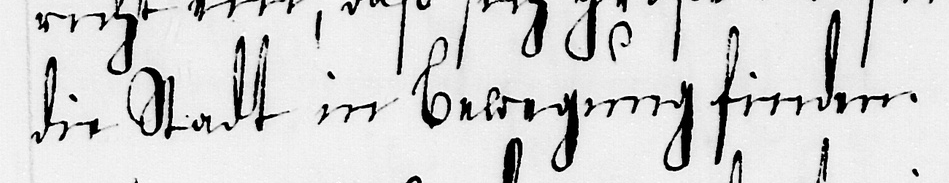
die Stadt in Bewegung finden.
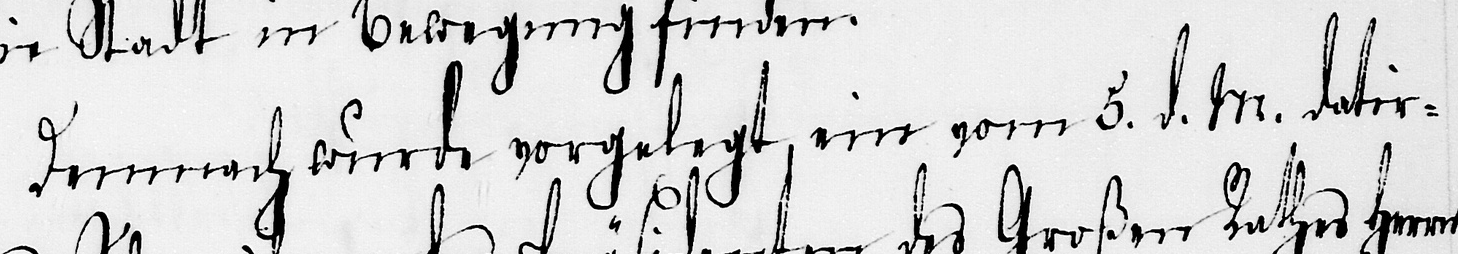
Demnach wurde vorgelegt, ein vom 5. d. M. datir¬
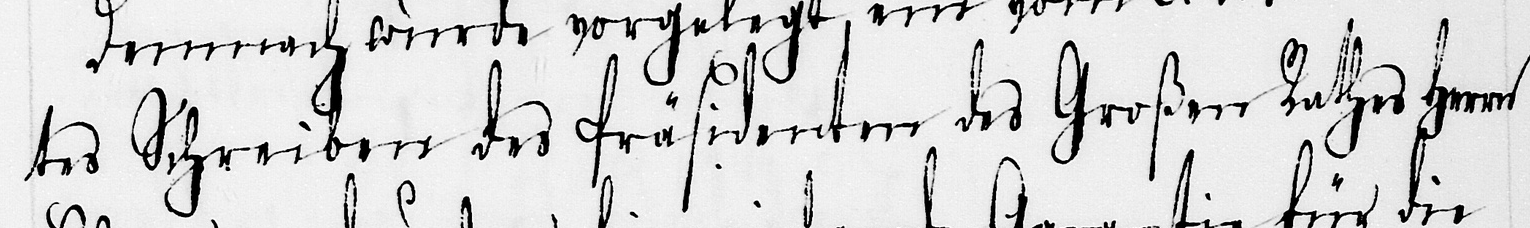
tes Schreiben des Präsidenten des Großen Rathes Her¬
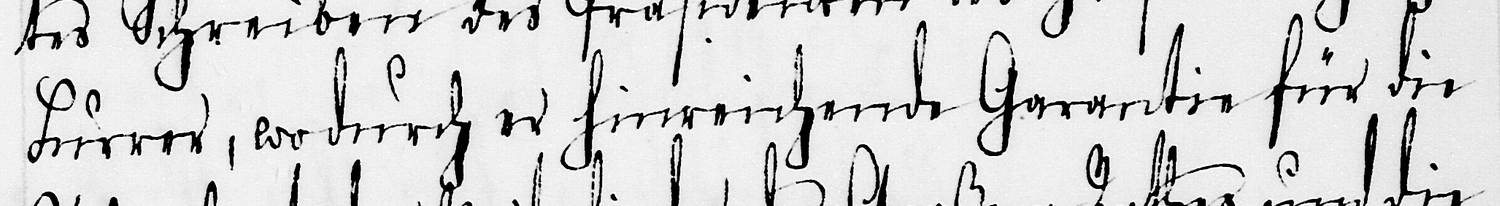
Furrer, wodurch er hinreichende Garantie für die
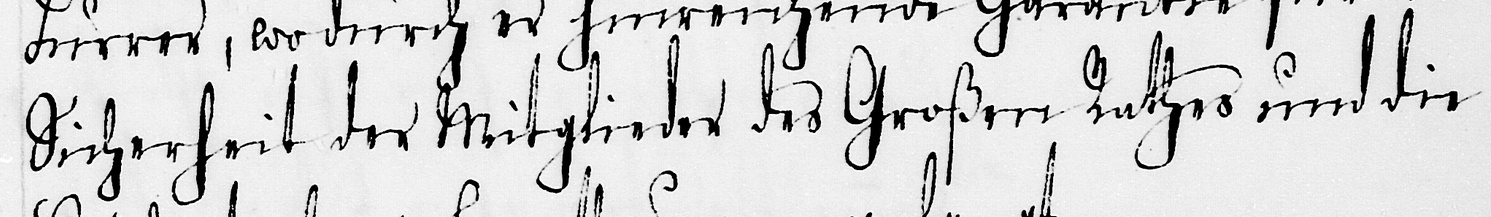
Sicherheit der Mitglieder des Großen Rathes und die
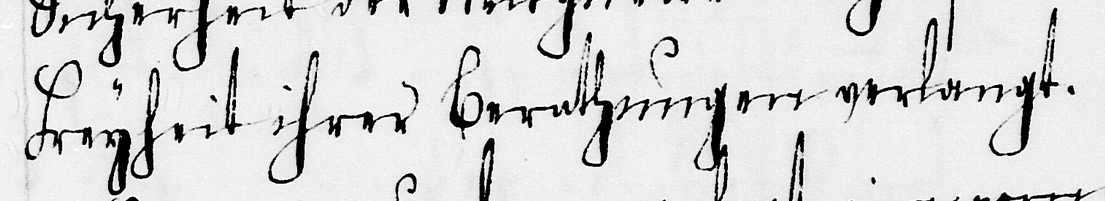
Freyheit ihrer Berathungen verlangt.
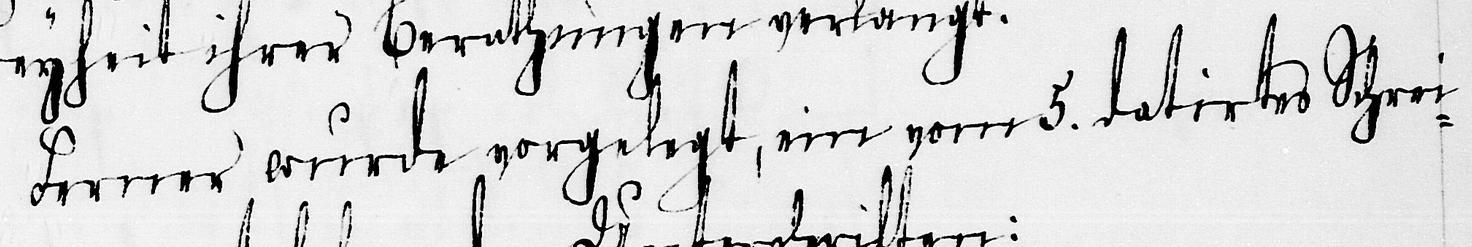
Ferner wurde vorgelegt, ein vom 5. datirtes Schrei¬
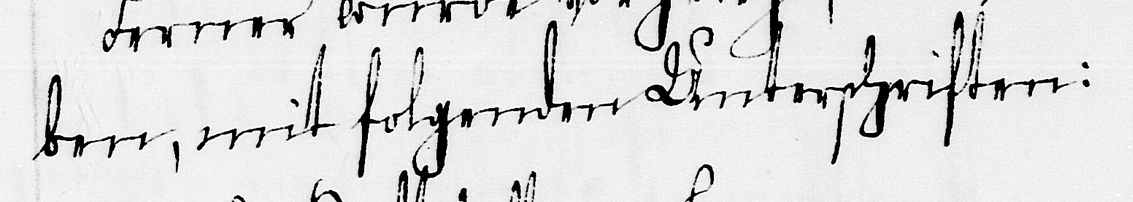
ben, mit folgenden Unterschriften:
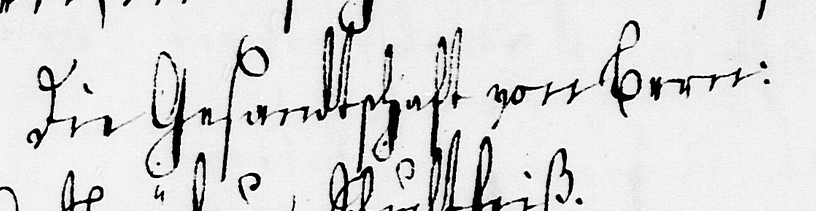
Die Gesandtschaft von Bern:
